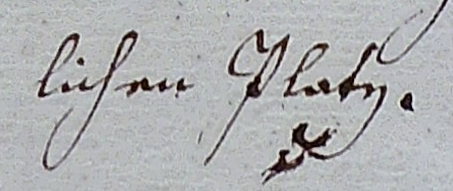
lichen Platz.
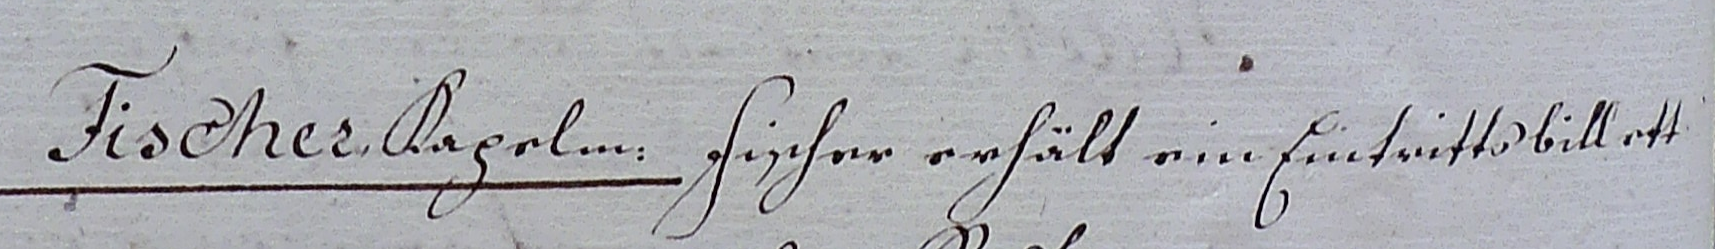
Fischer, Kapelm: Fischer erhält ein Eintrittsbillett
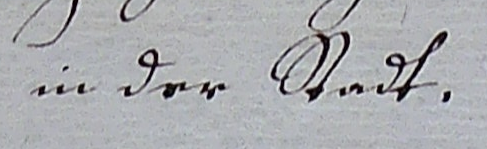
in der Stadt.
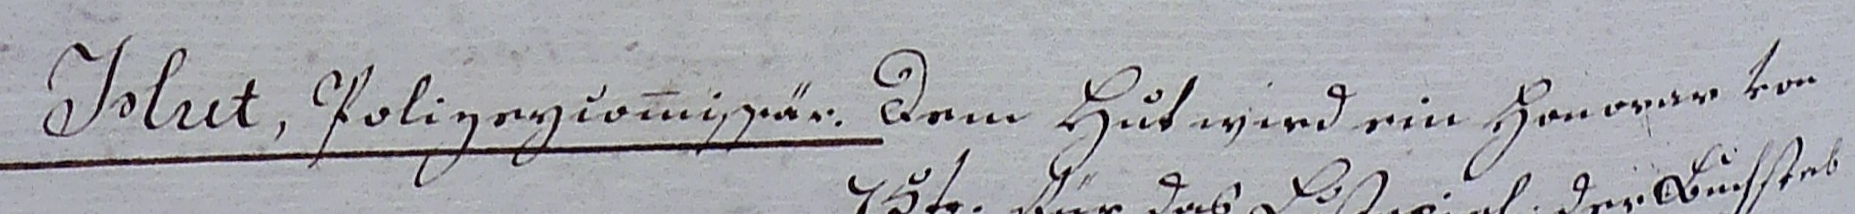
Hut, Polizeycom̅issär. Dem Hut wird ein Honorar von
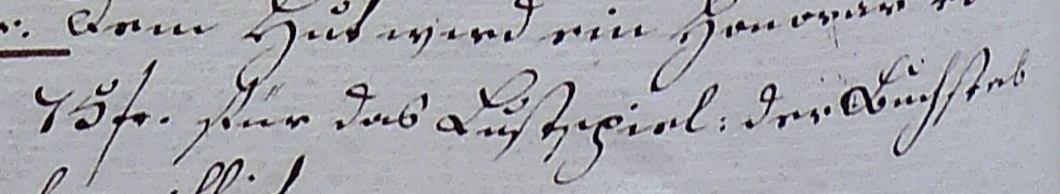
75fr. für das Lustspiel: der Buchstab
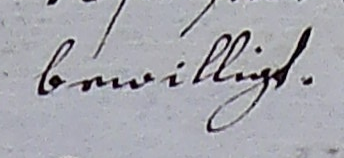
bewilligt.
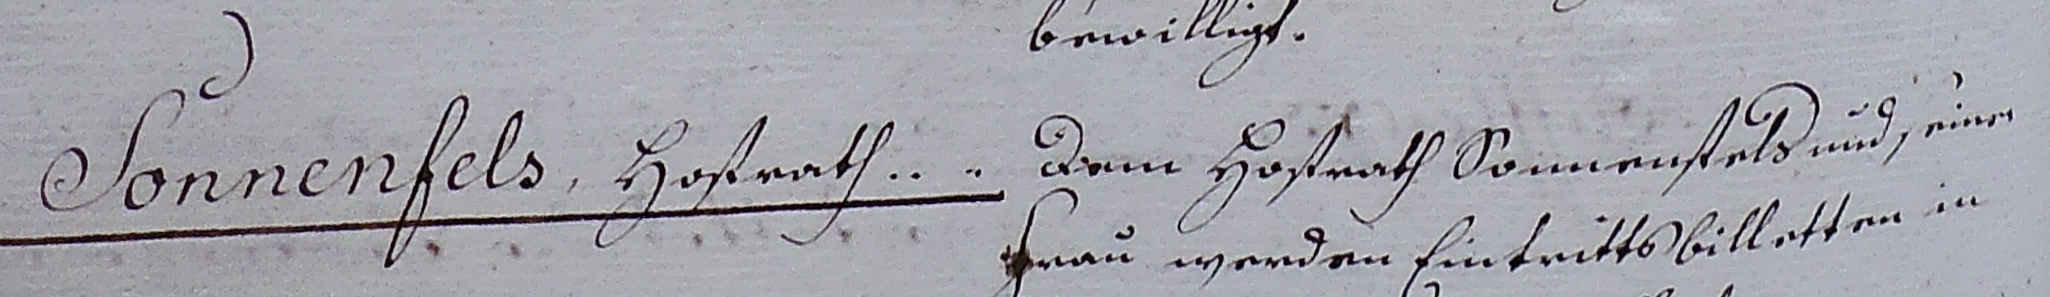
Sonnenfels, Hofrath . . .. Dem Hofrath Sonnenfels und seiner
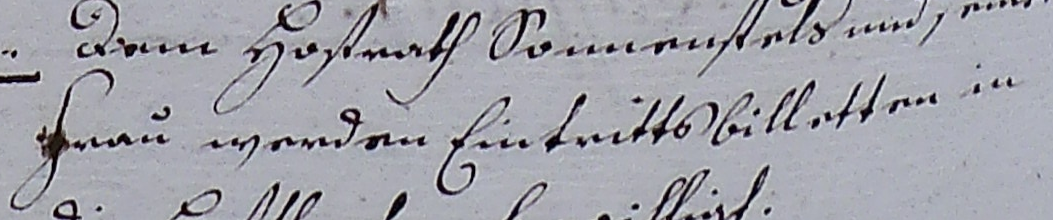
Frau werden Eintrittsbilletten in
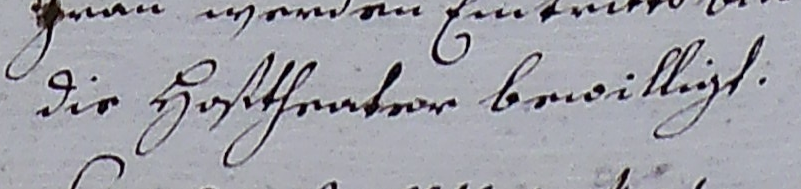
die Hoftheater bewilligt.
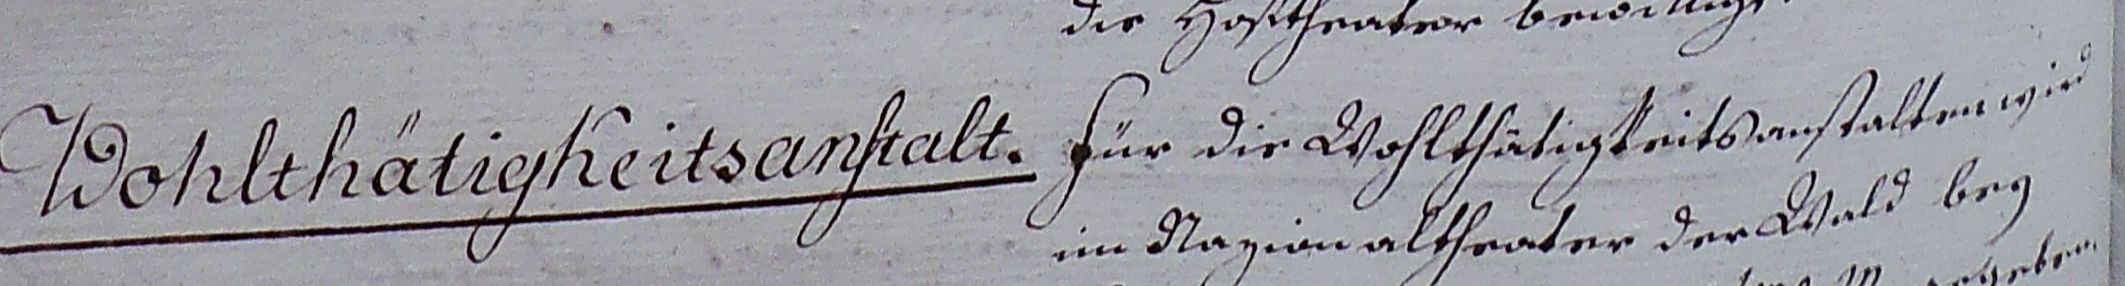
Wohlthätigkeitsanstalt. Für die Wohlthätigkeitsanstalten wird
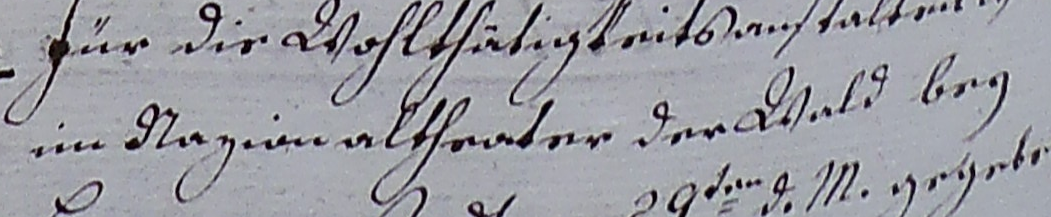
im Nazionaltheater der Wald bey
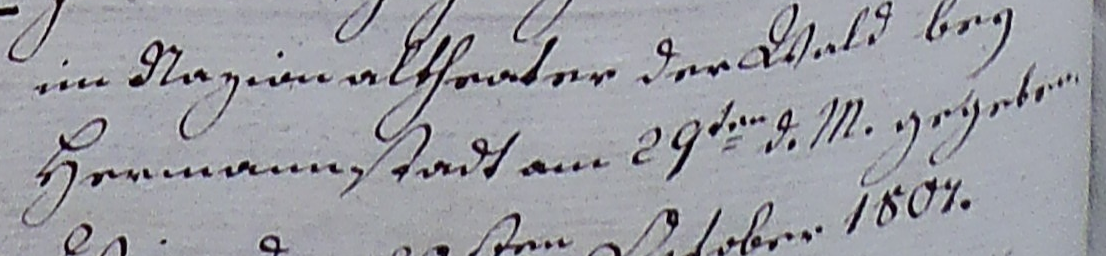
Hermannstadt am 29te͇n d.M. gegeben.
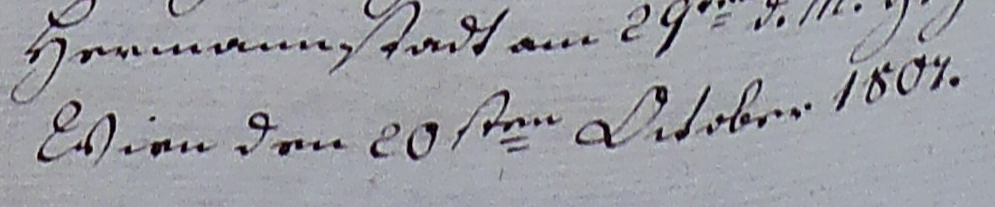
Wien den 20ste͇n October 1807.
